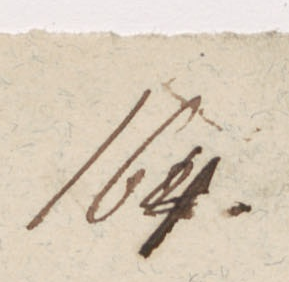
1644.
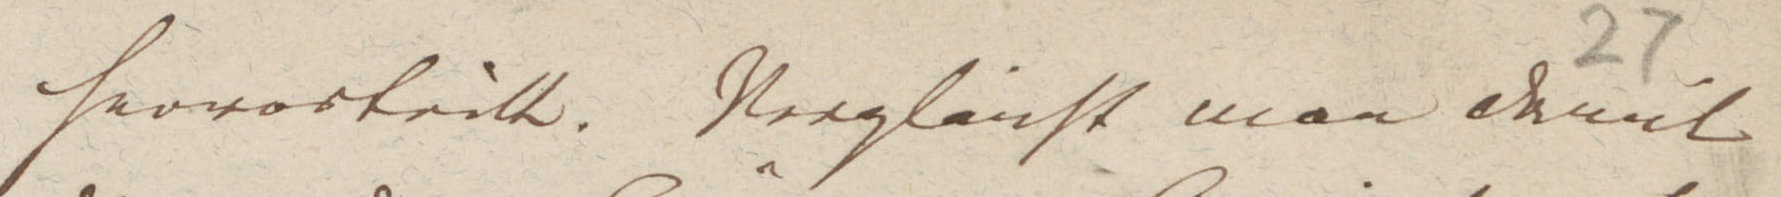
hervortritt. Vergleicht man damit
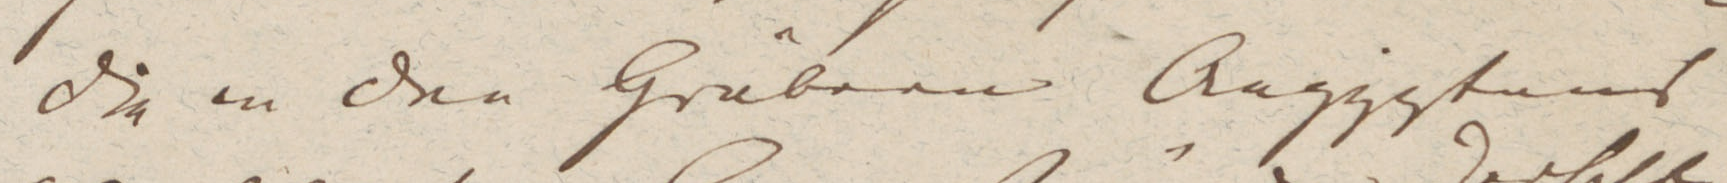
die in den Gräbern Aegyptens
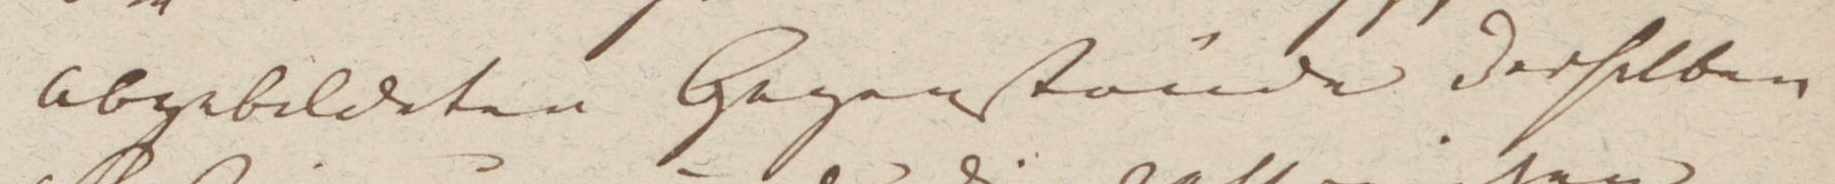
abgebildeten Gegenstände derselben
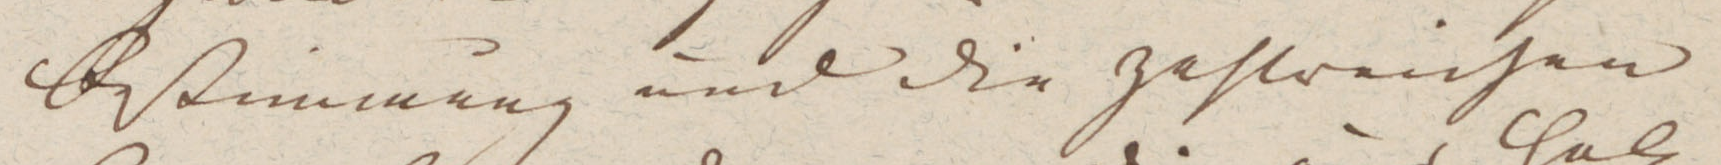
Bestimmung und die zahlreichen
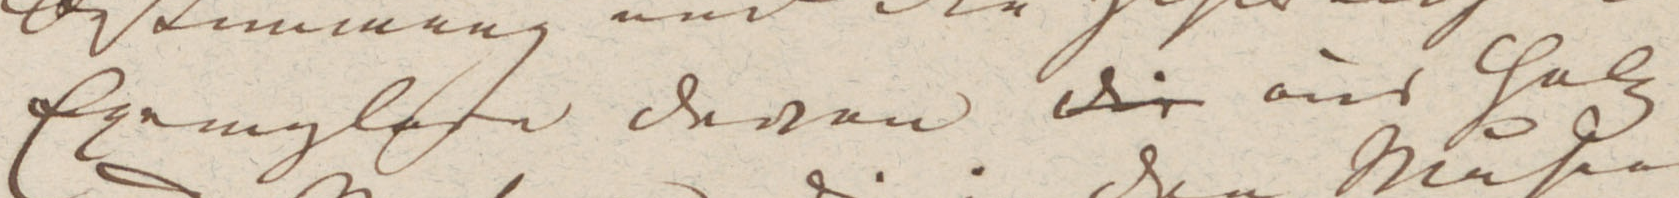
Exemplare davon die aus Holz
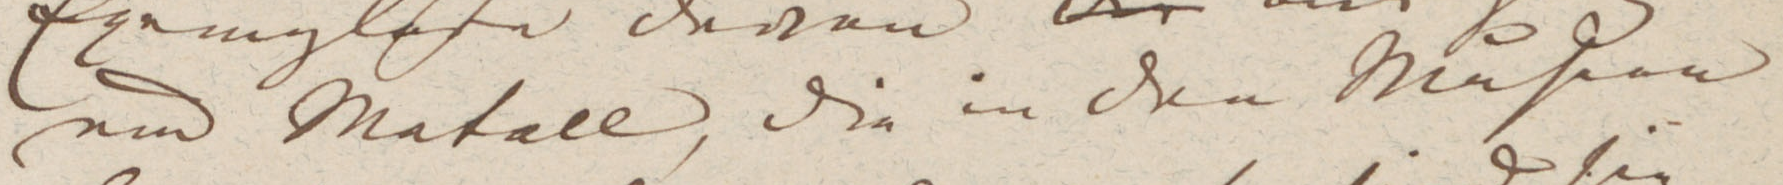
und Metall, die in den Museen
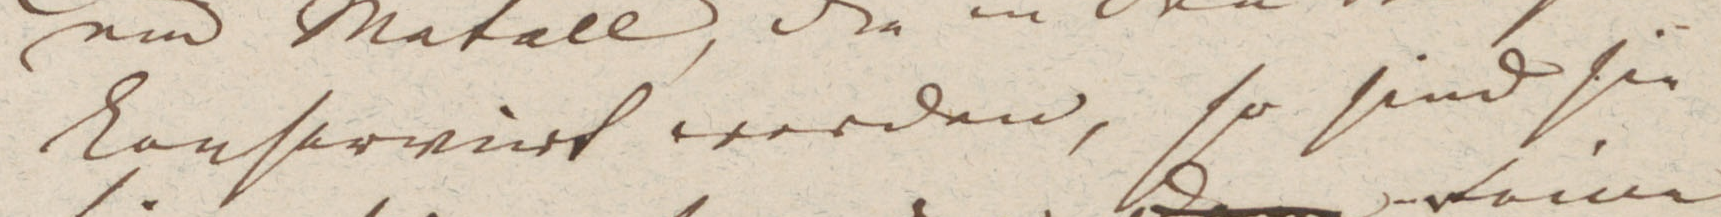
konservirt werden, so sind sie
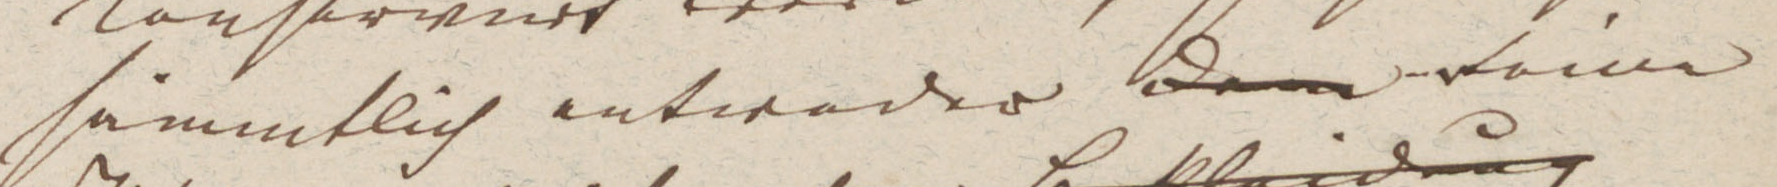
sämmtlich entweder dem reine
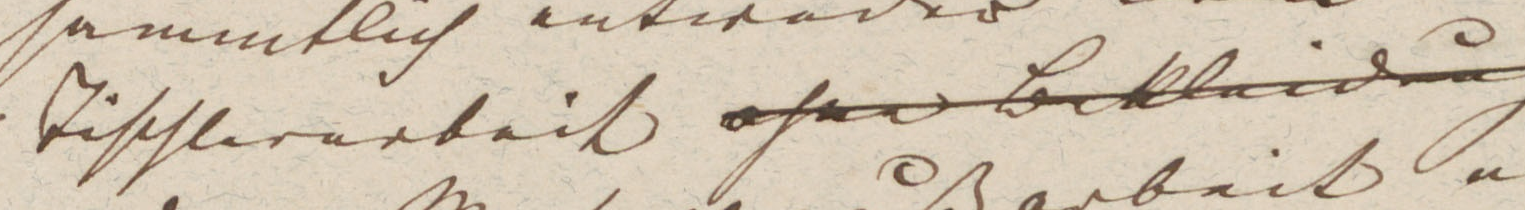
Tischlerarbeit ohne Bekleidung
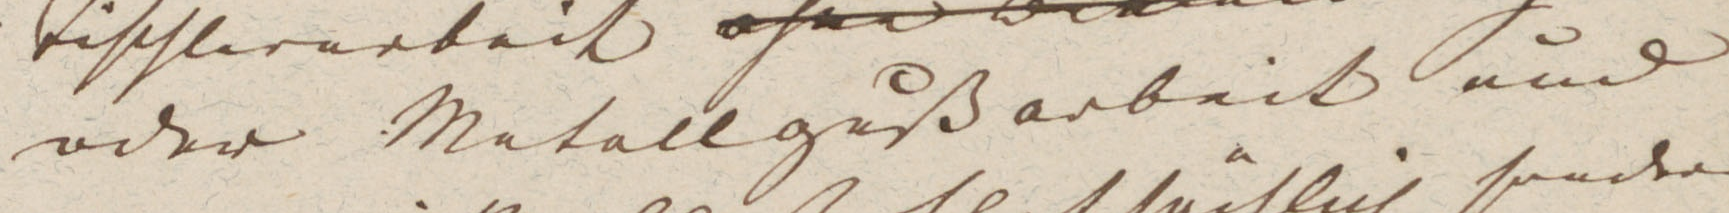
oder Metallgussarbeit und
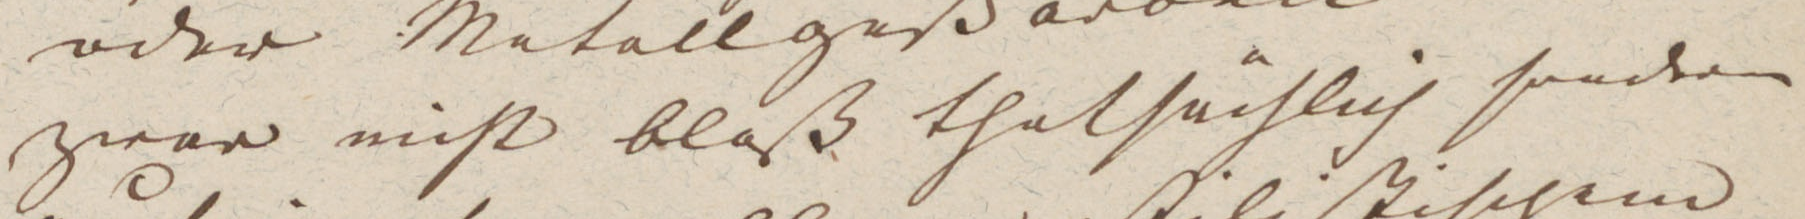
zwar nicht bloss thatsächlich sondern
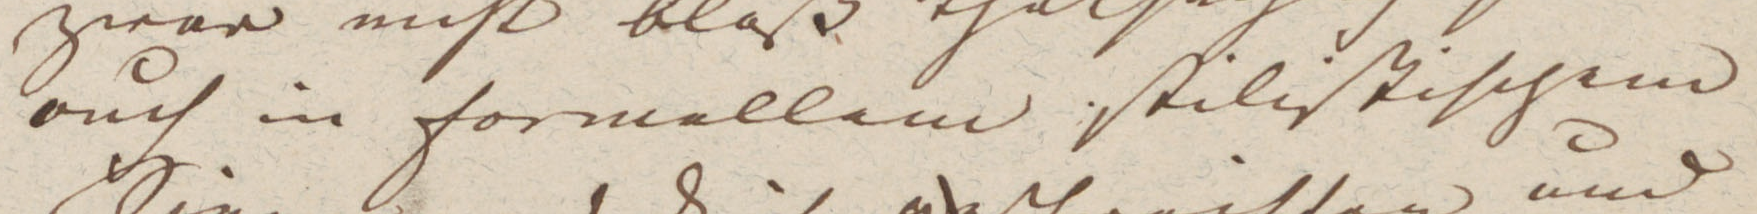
auch in formellem stilistischem
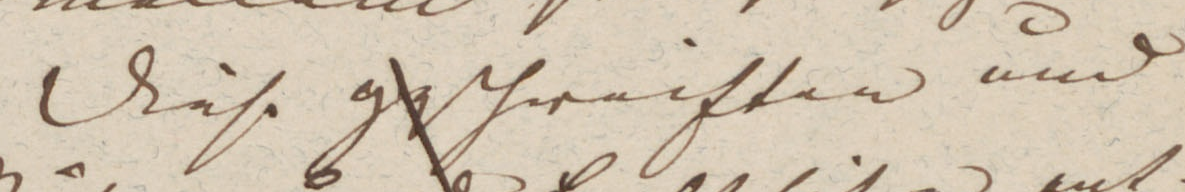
Diese geschweiften und
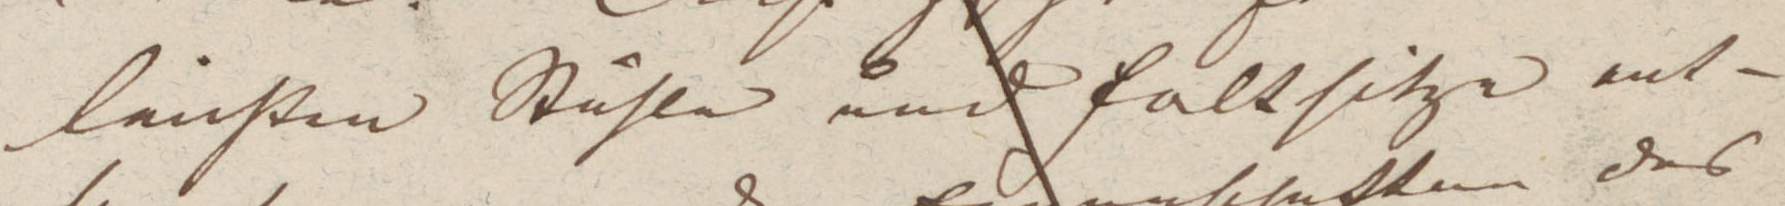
leichten Stühle und Faltsitze ent-
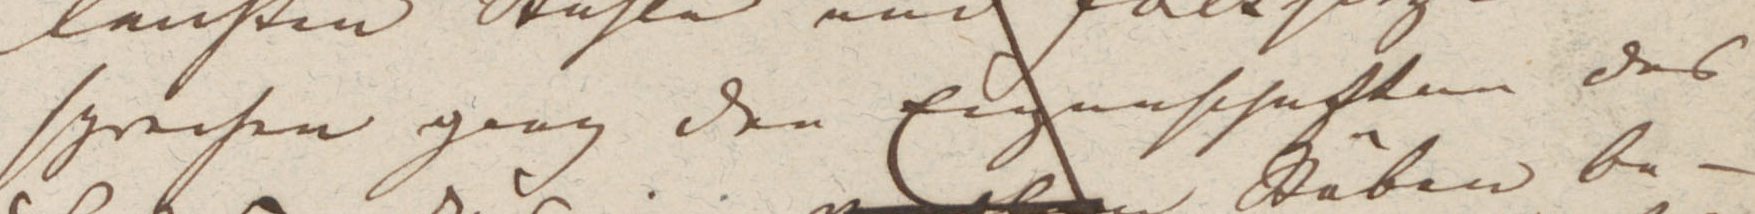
sprechen ganz den Eigenschaften des
